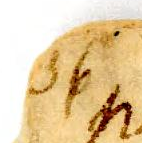36
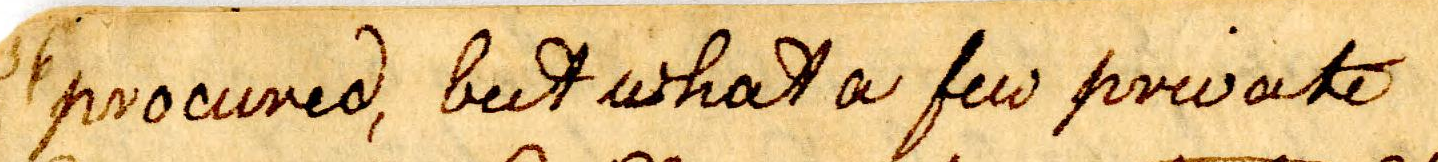procured, but what a few private
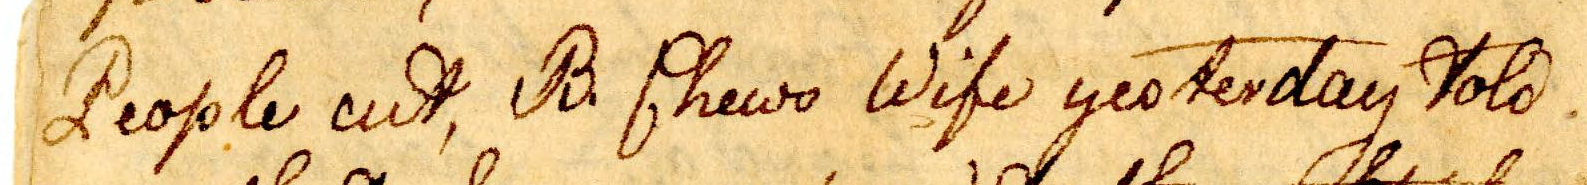People cut, B Chews Wife yesterday told
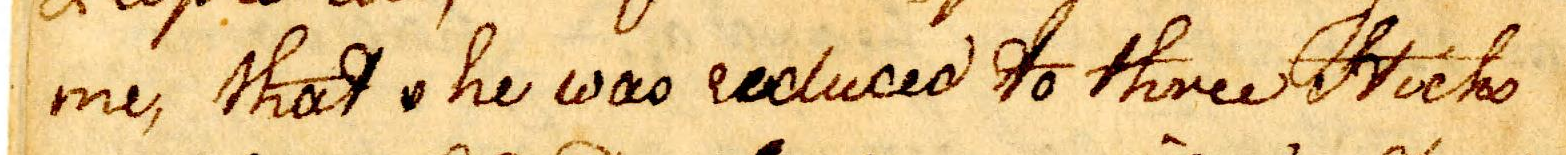me, that she was reduced to three Sticks
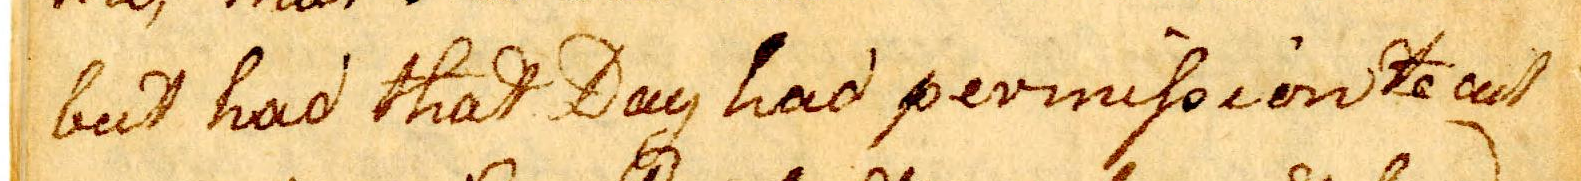but had that Day had permission to cut
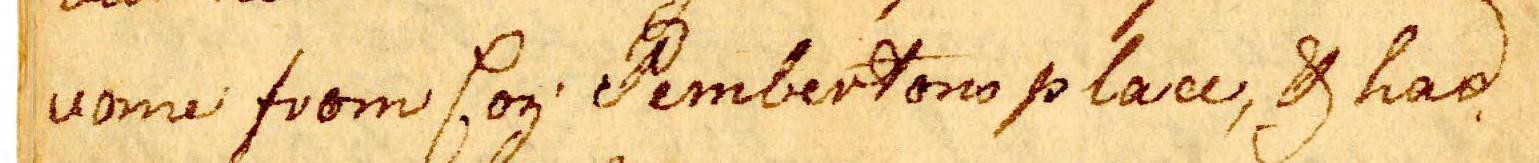some from Coz Pembertons place, & had
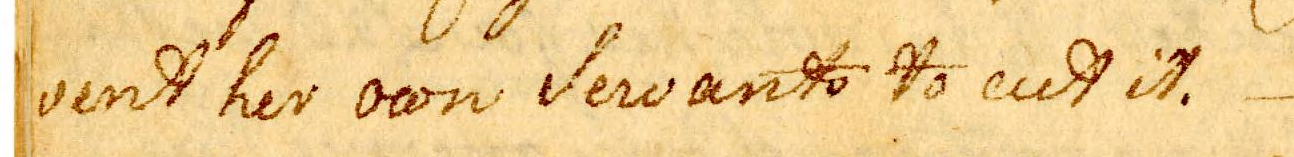sent her own Servants to cut it.
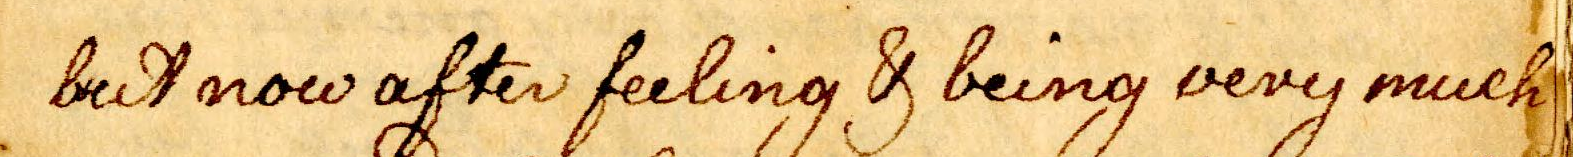but now after feeling & being very much
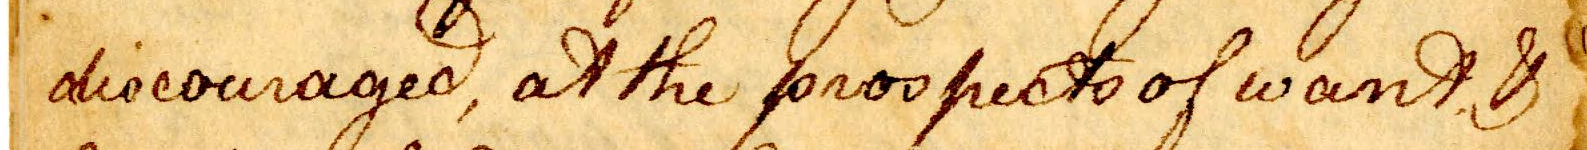discouraged, at the prospects of want &
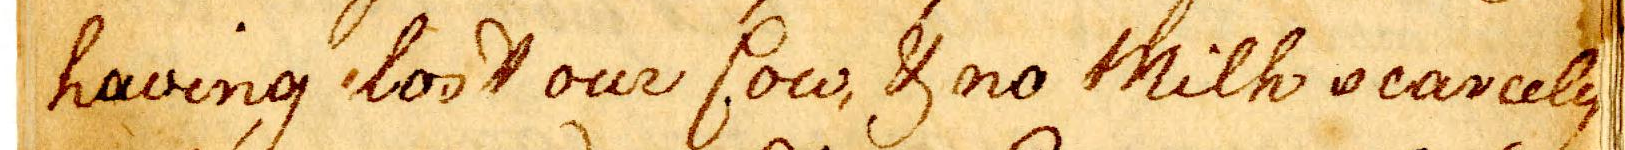having lost our Cow, & no Milk scarcely
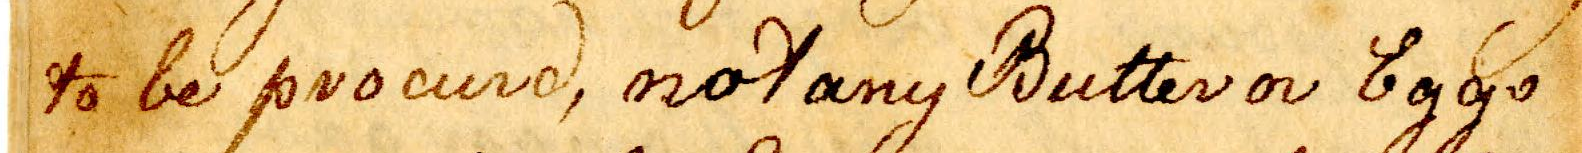to be procurd, not any Butter or Eggs
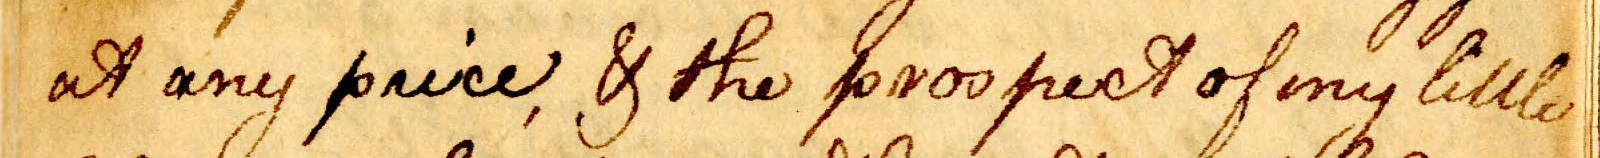at any price & the prospect of my little
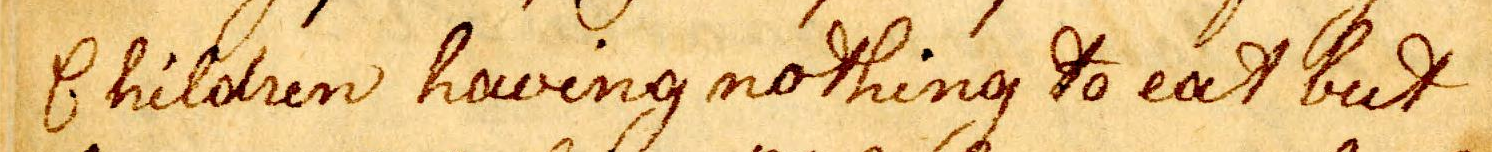Children having nothing to eat but
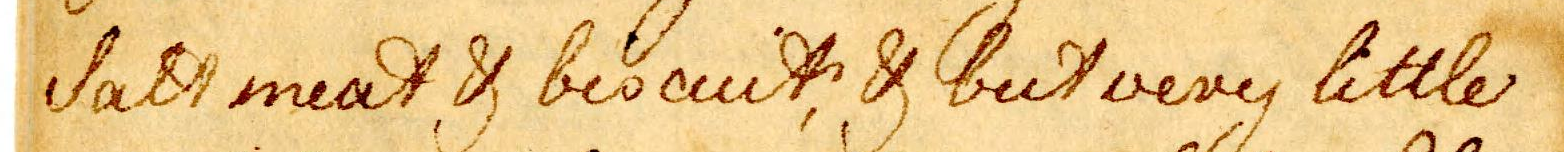Salt meat & biscuit, & but very little
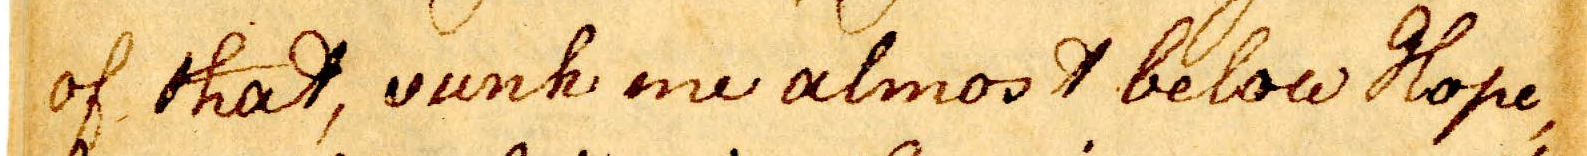of that, sunk me almost below Hope,
